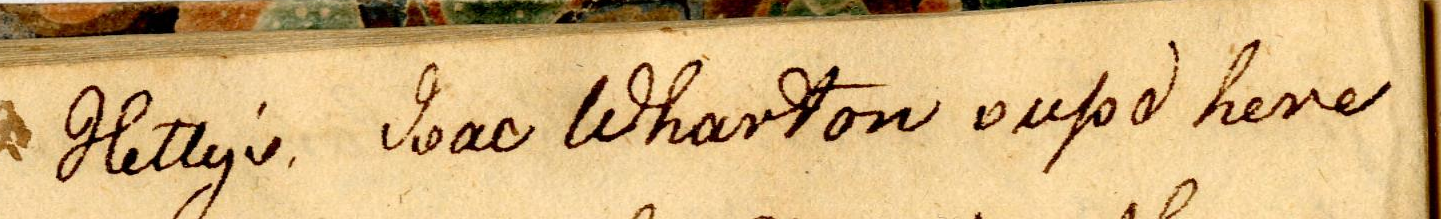Hetty's. Isac Wharton supd here
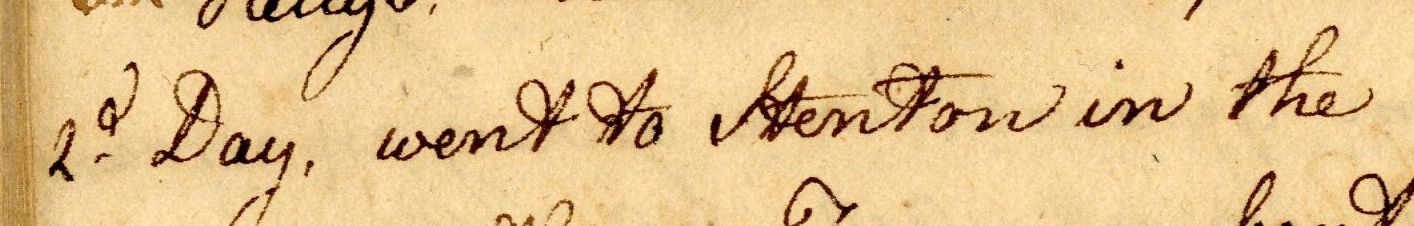3^d Day. went to Stenton in the
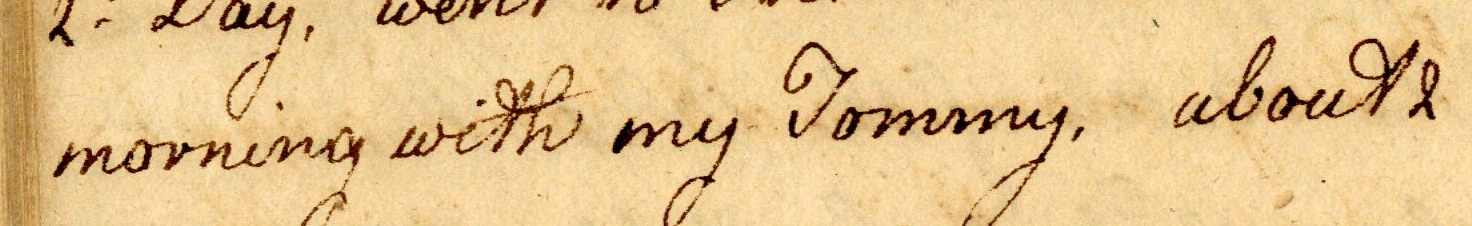morning with my Tommy, about 2
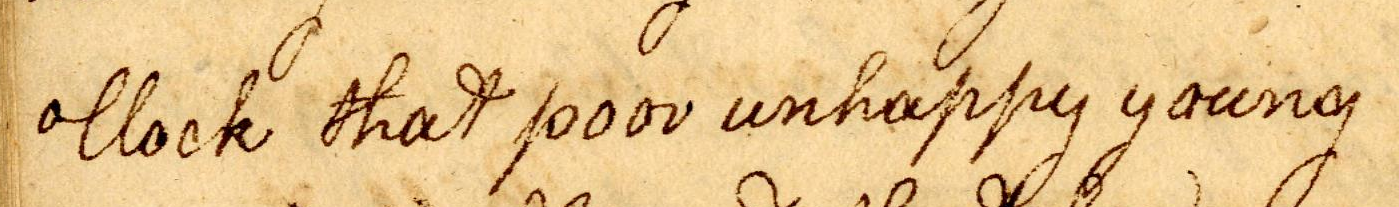^oClock that poor unhappy young
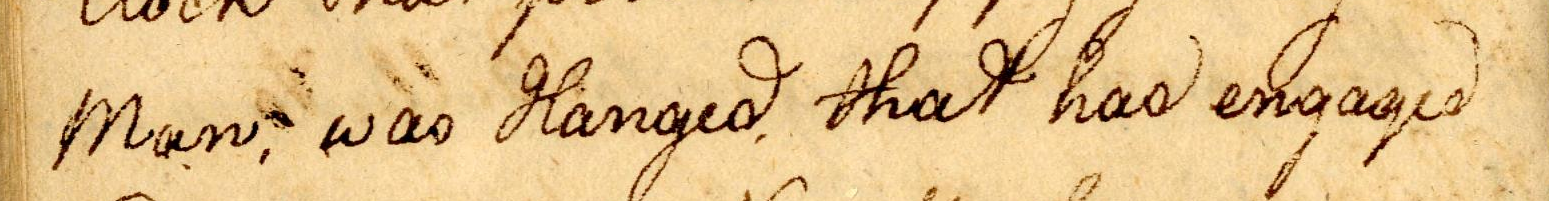Man, was Hanged that has engaged
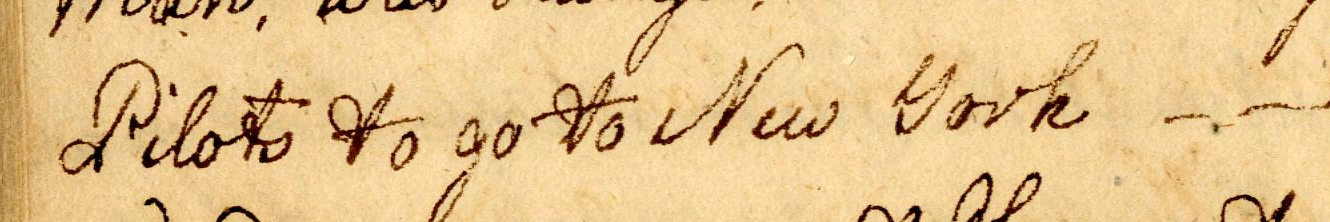Pilots to go to New York-
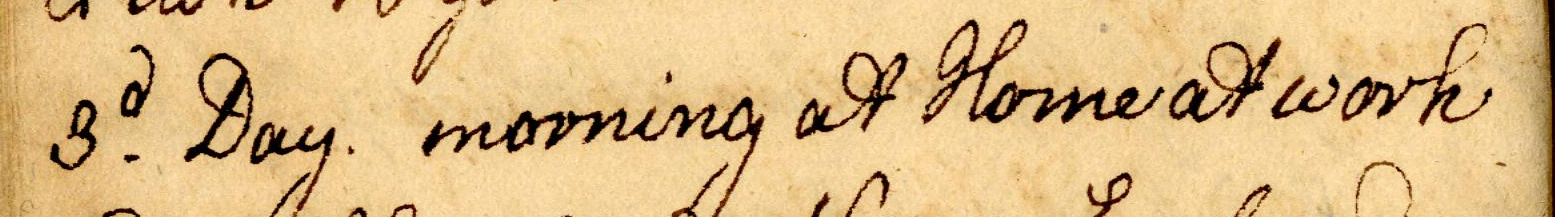3^d. Day. morning at Home at work
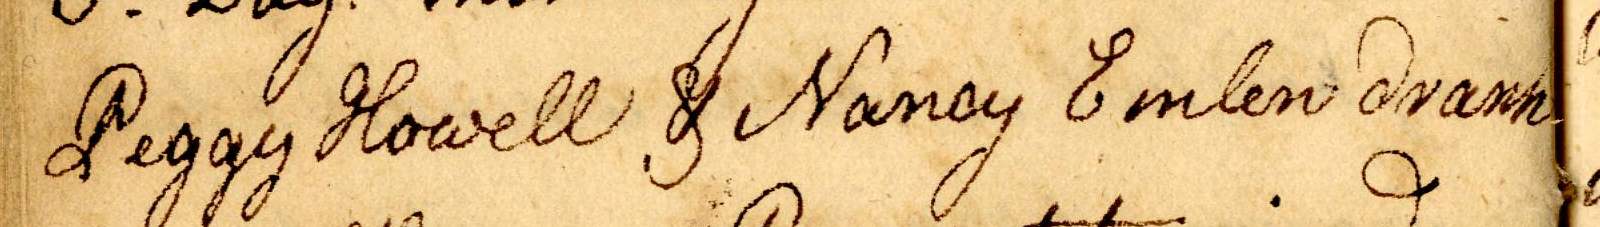Peggy Howell & Nancy Emlen drank
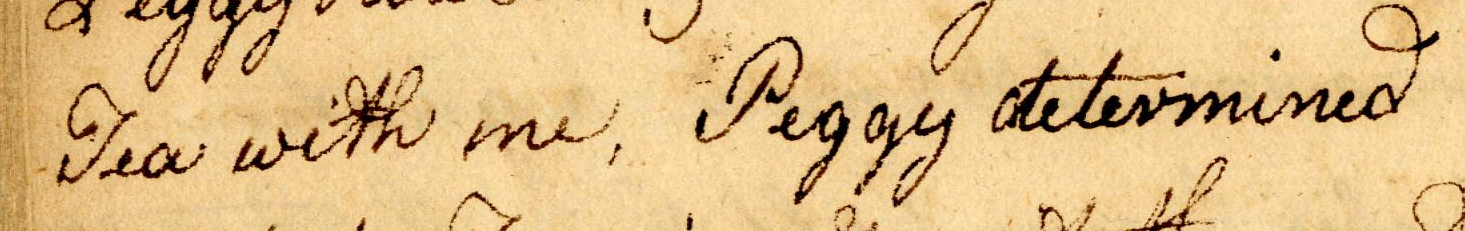Tea with me, Peggy determined
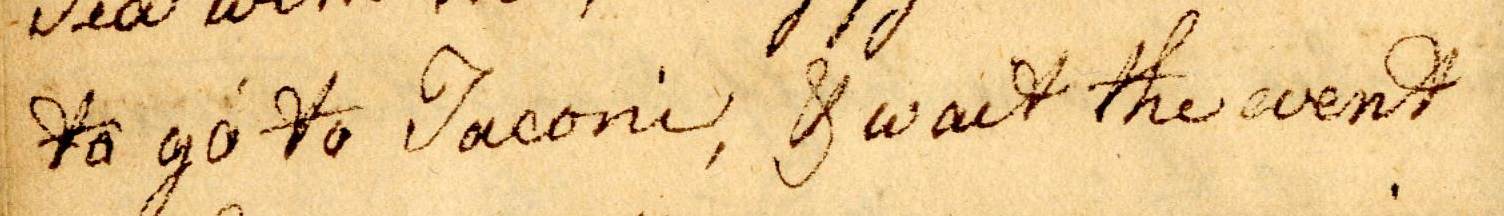to go to Taconi, & wait the event
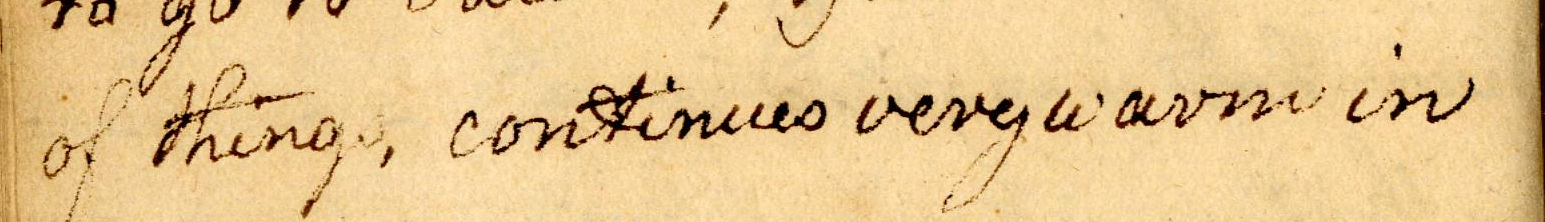of things, continues very warm in
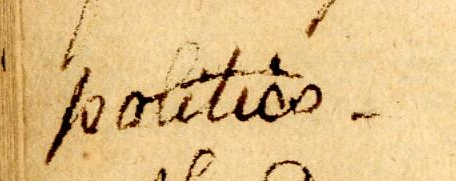politics-
